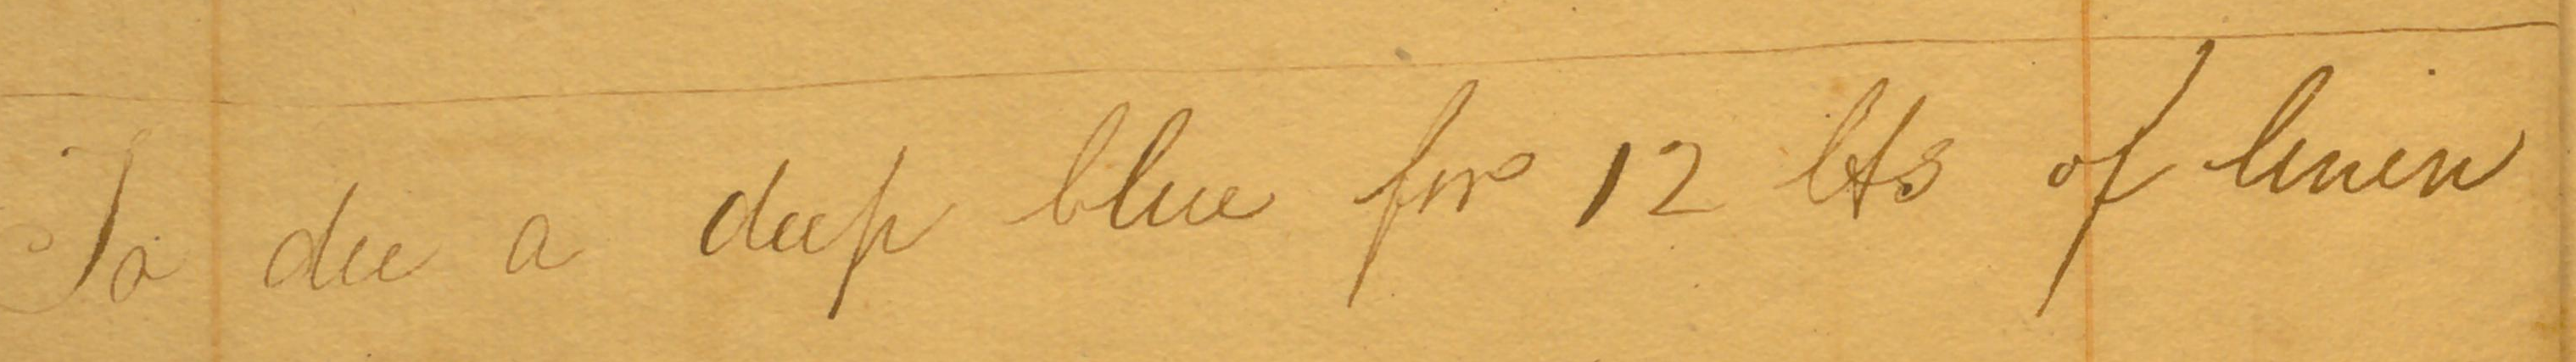To die a deep blue for 12 lbs of linen
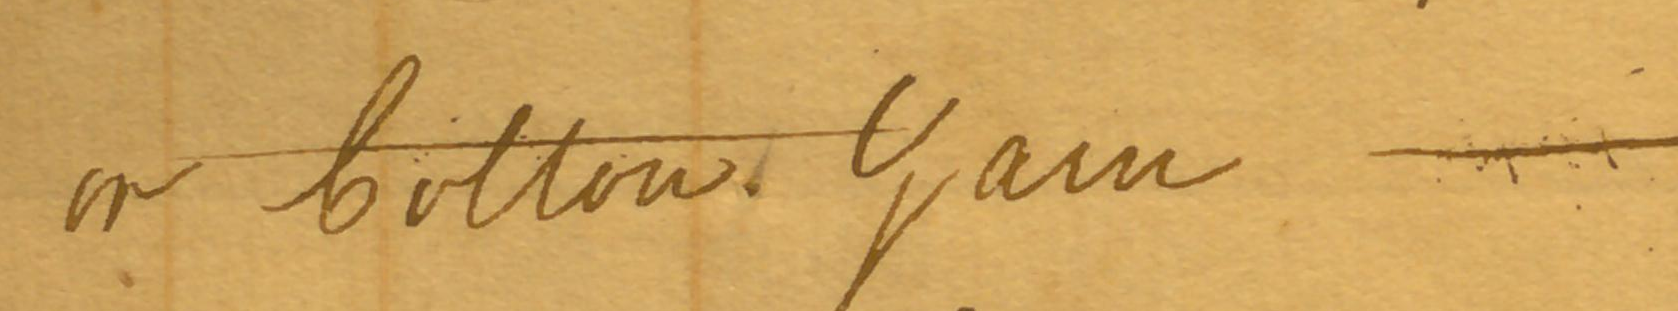or Cotton yarn
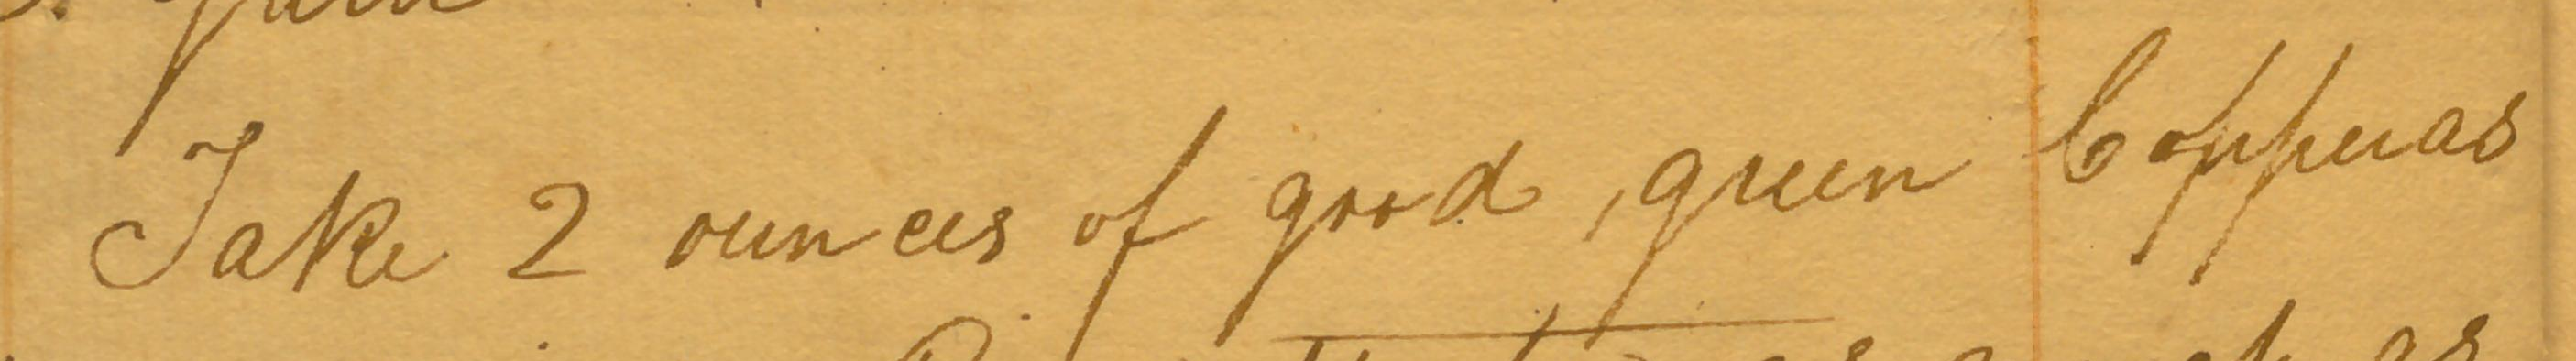Take 2 ounces of good green Copperas
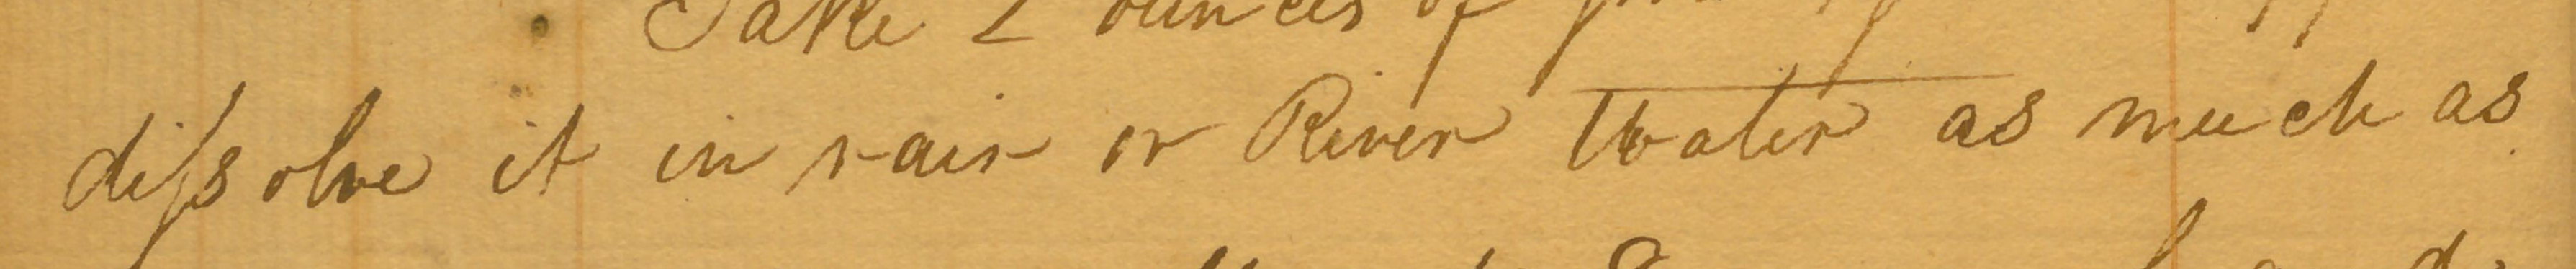dissolve it in rain or River Water as much as
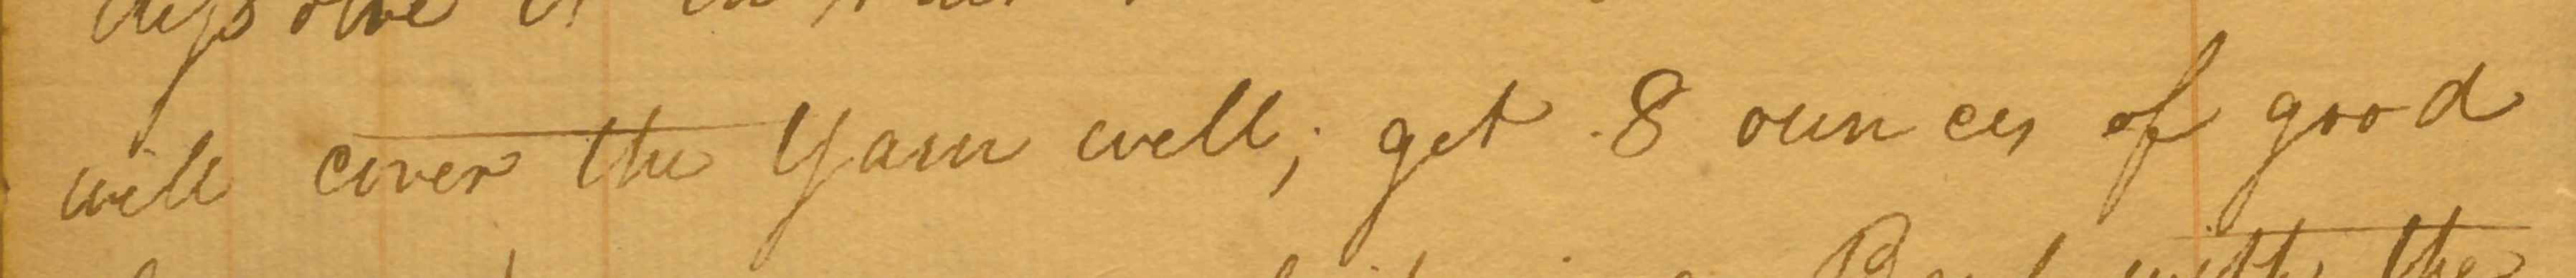will cover the Yarn well; get 8 ounces of good
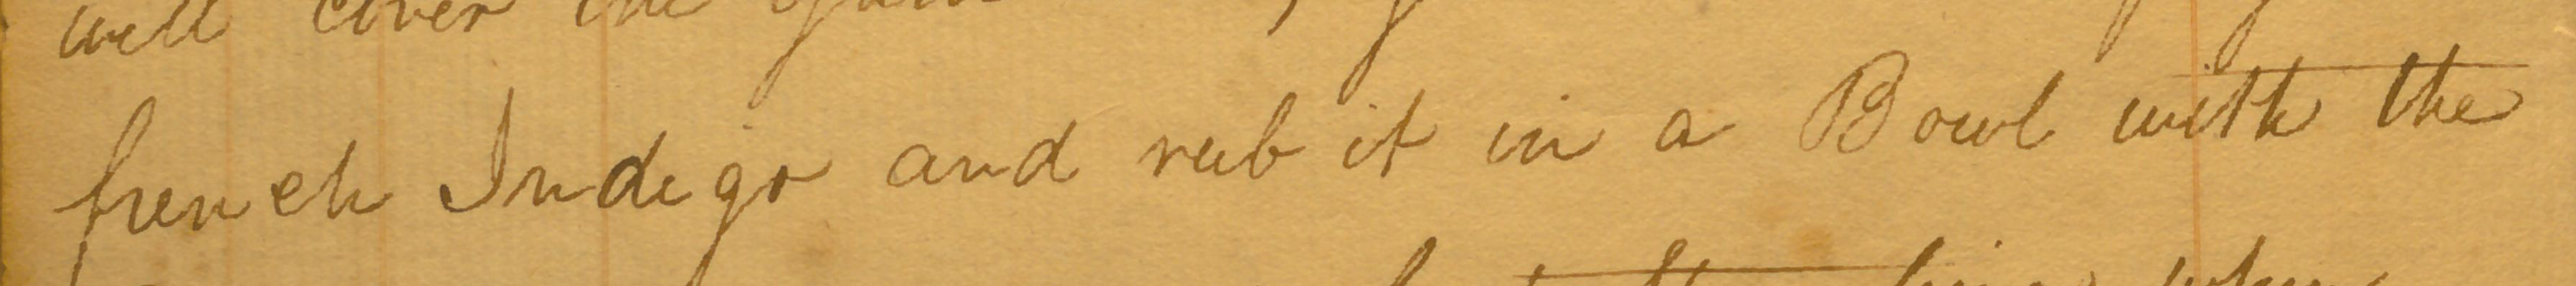french Indigo and rub it in a Bowl with the
